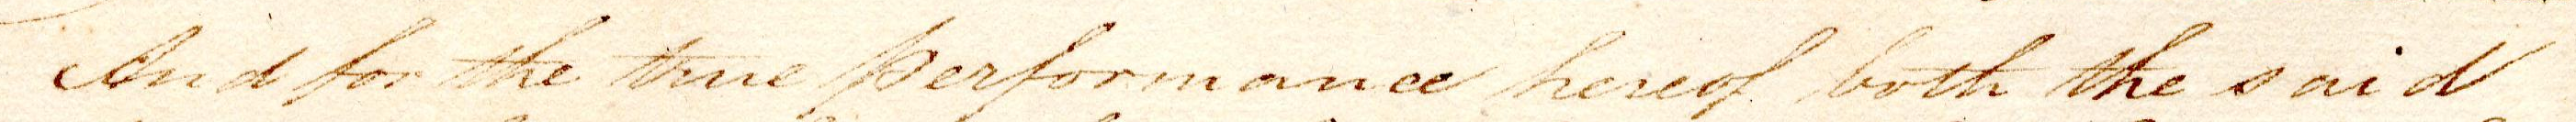And for the true performance hereof both the said
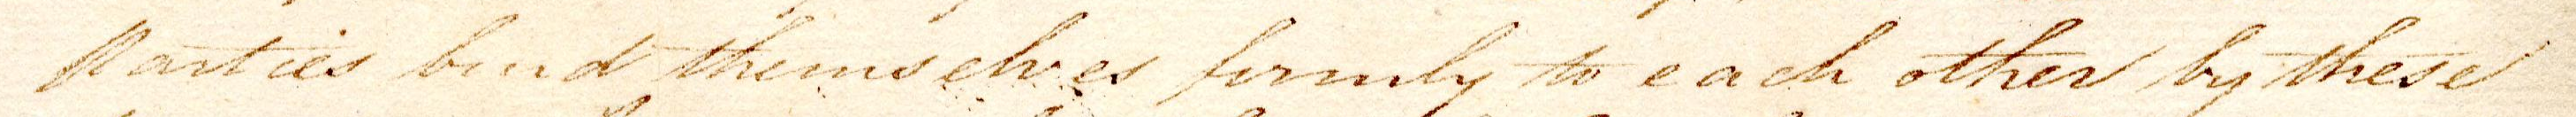Parties bind themselves formerly to each other by these
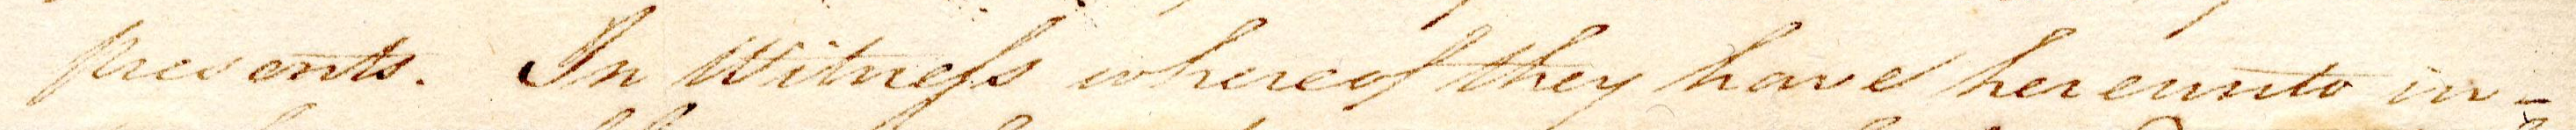presents. In Witness whereof they have hereunto in-
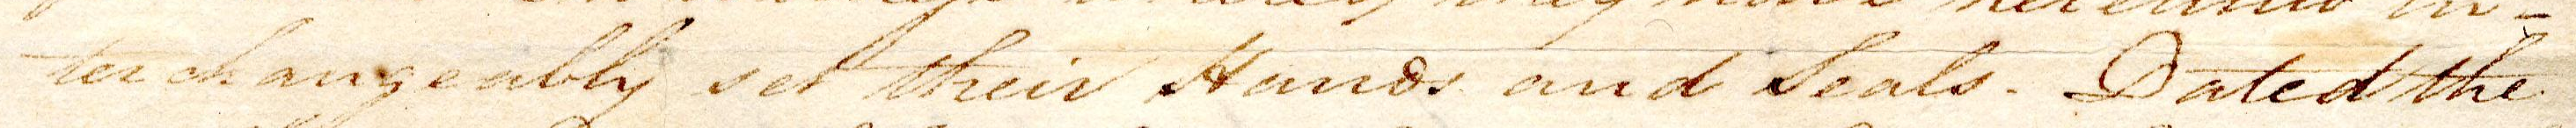-terchangeably set their Hands and Seals. Dated the
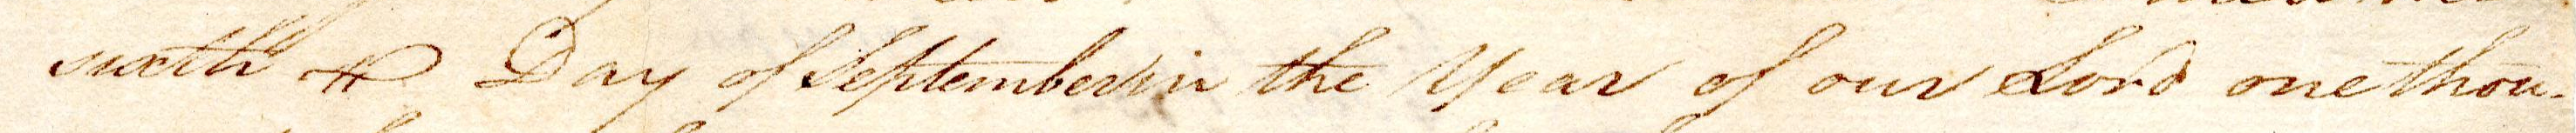sixth Day of September in the year of our Lord one thou-
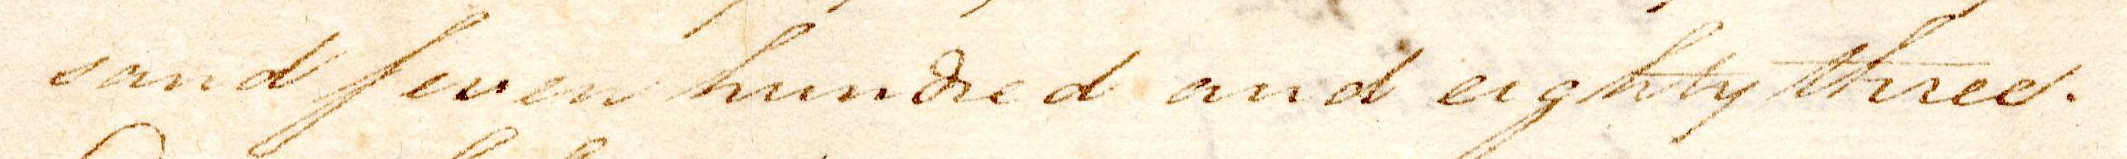-sand seven hundred and eighty three.
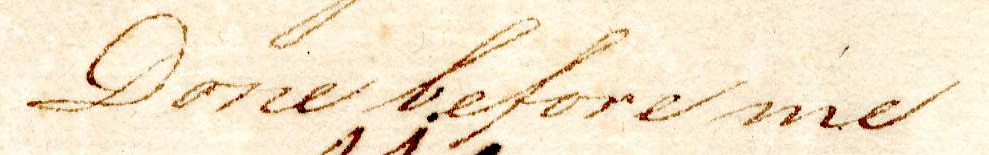Done before me
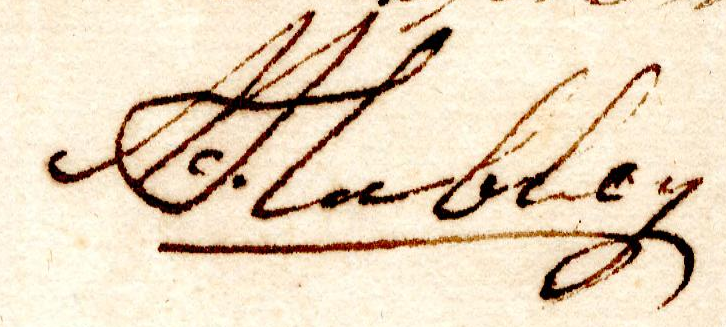M^cCabley
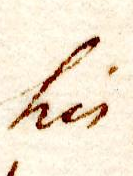his
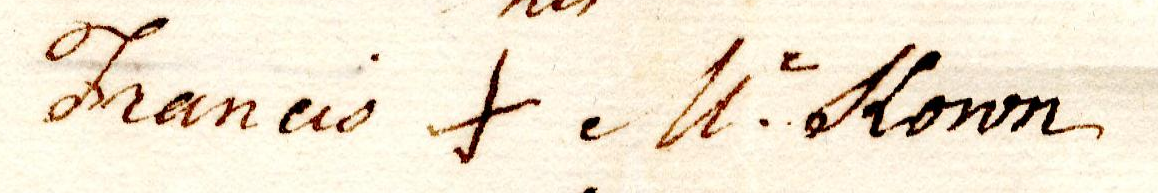Francis & M^c.Kown
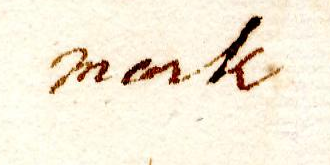mark
